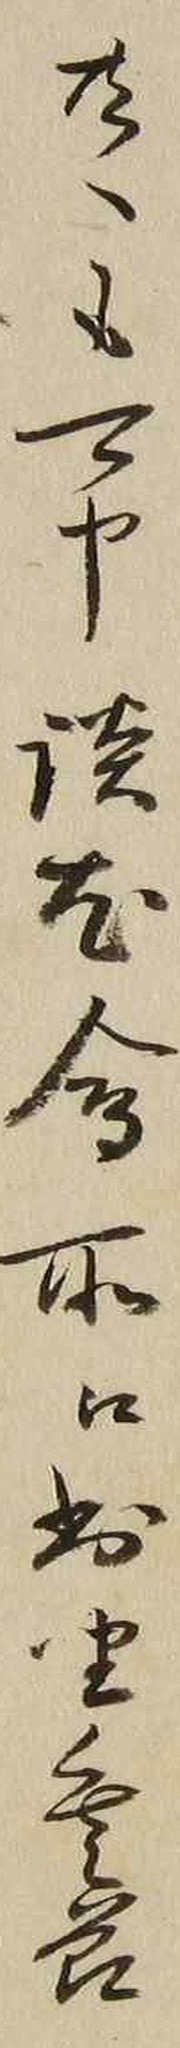共へも可申談尤会所江出座無節
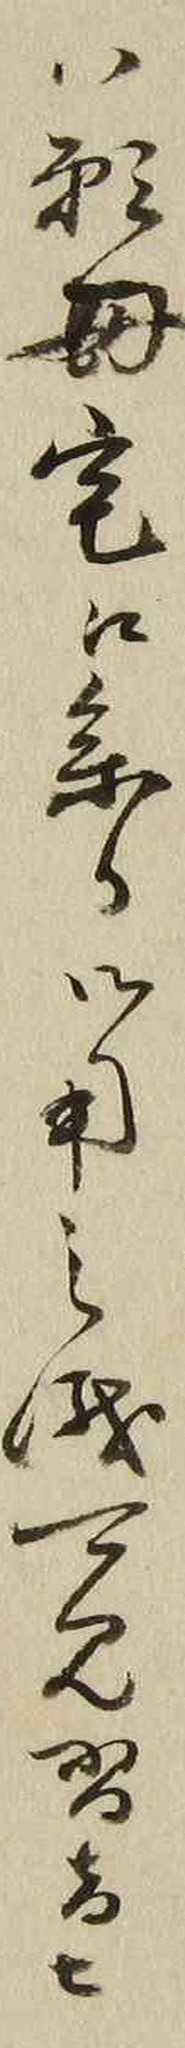は賴母宅江参り御用之儀可見習旨被
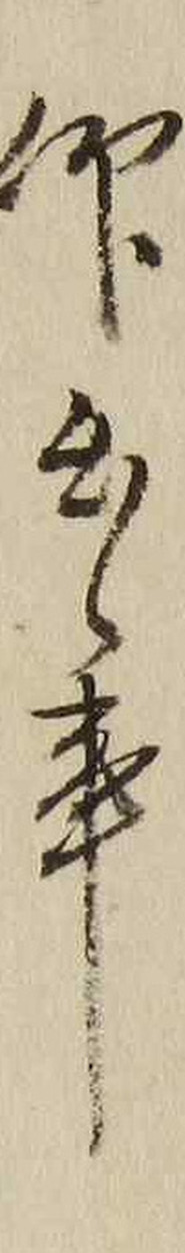仰出候事
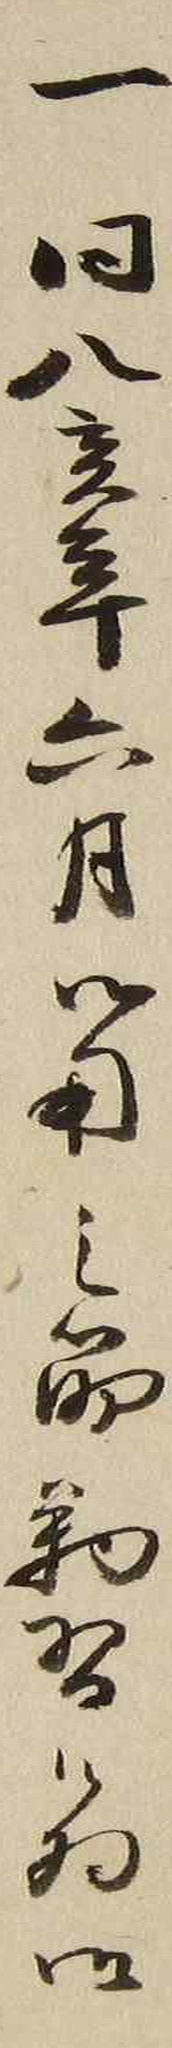一同八亥年六月御用之筋勤習候為御
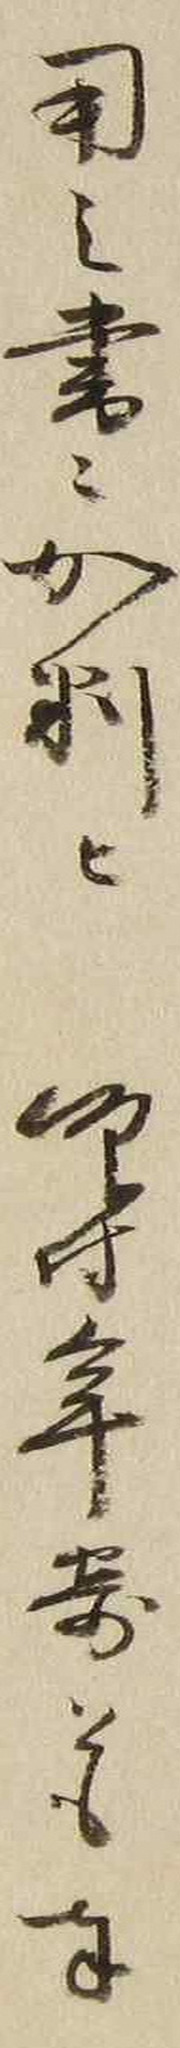用之書に加判被仰付年寄とも奉
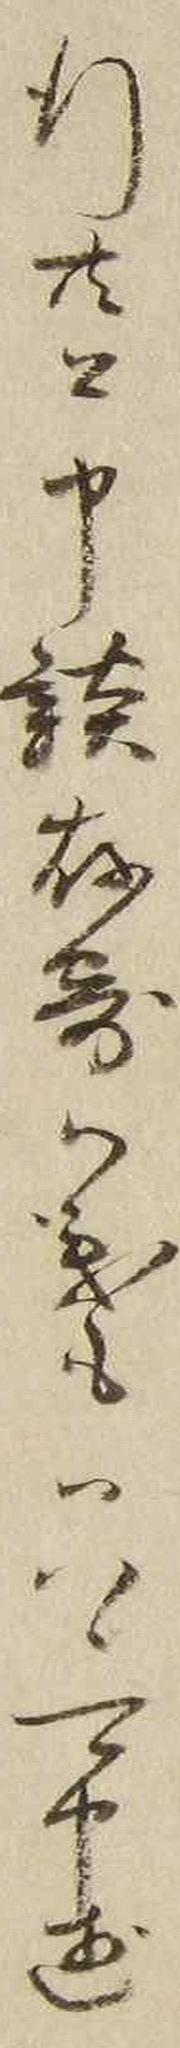行共と申談存寄之義も候はゝ可申述
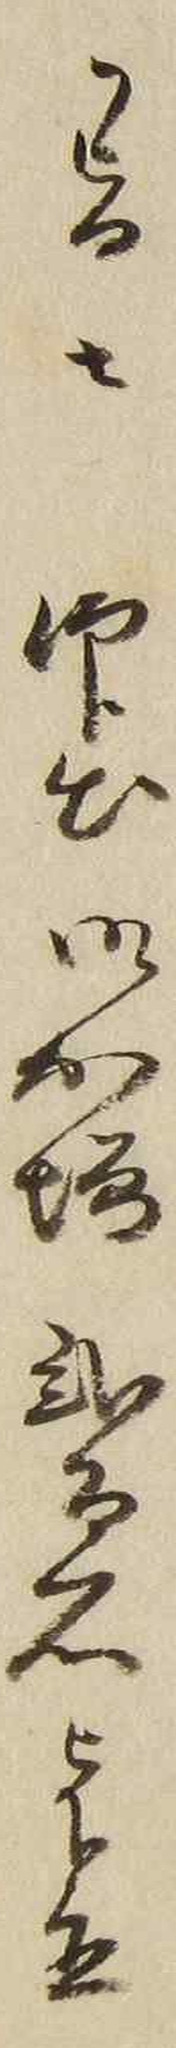旨被仰出御加増弐百石被下置

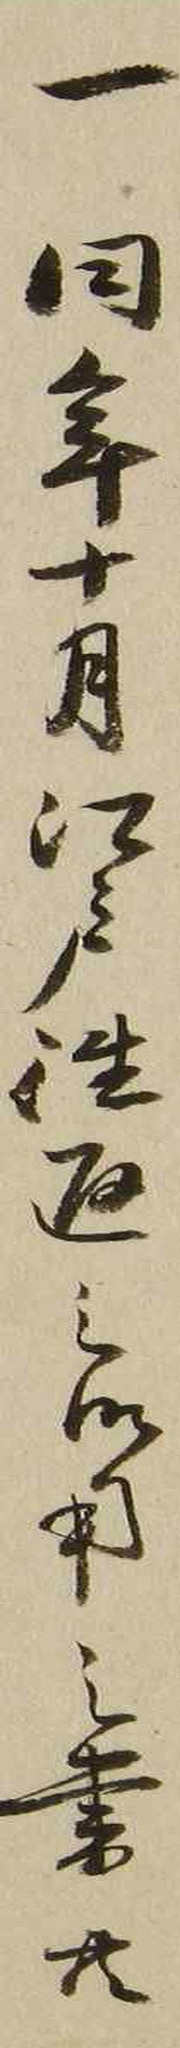一同年十月江戸往返之御用之書共
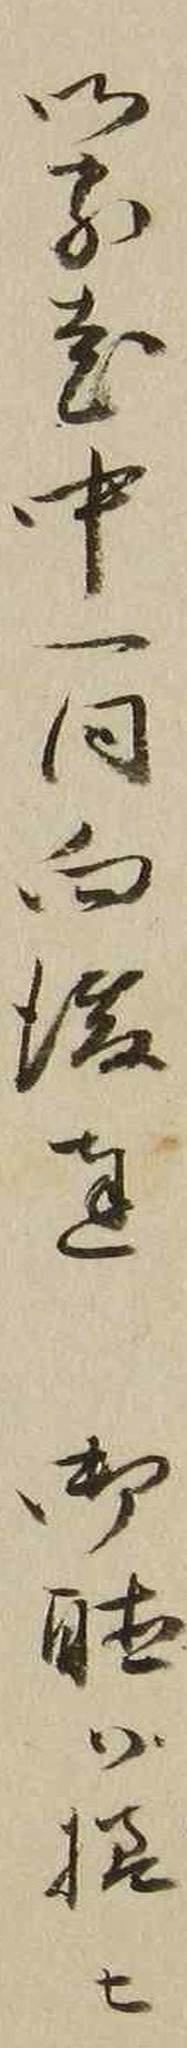御家老中一同向後達御聴候様被
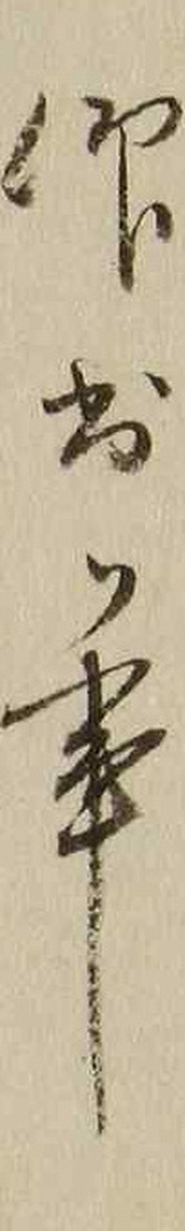仰出候事
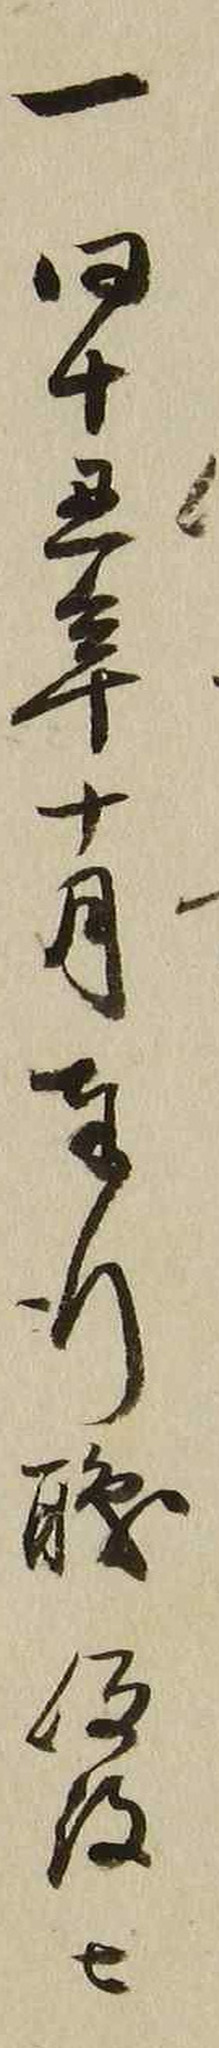一同十丑年十月奉行職仮役被
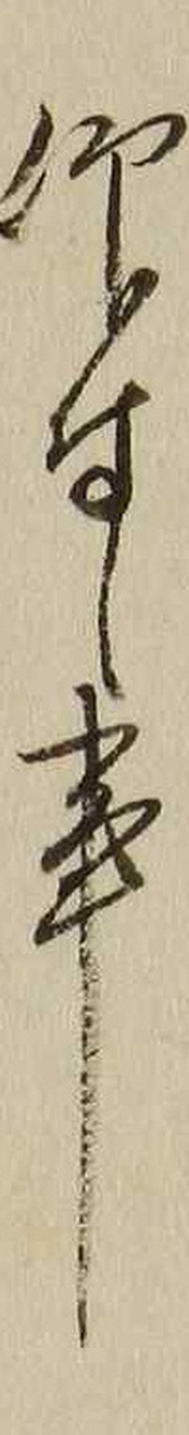仰付候事
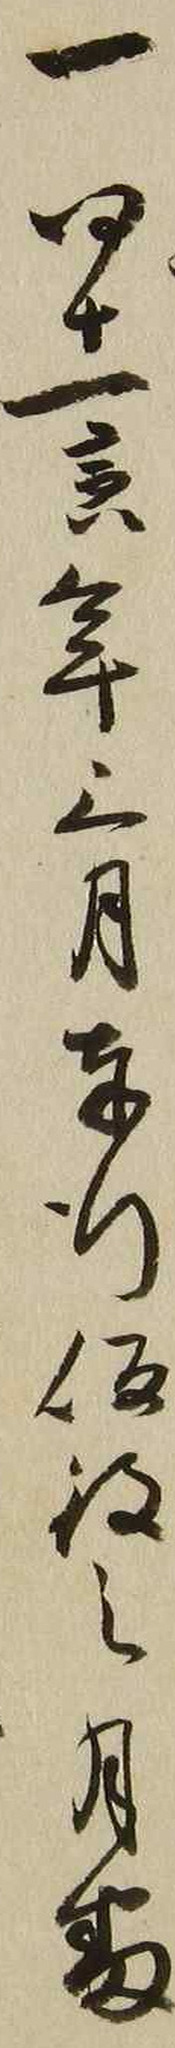一同十一亥年三月奉行仮役之月番
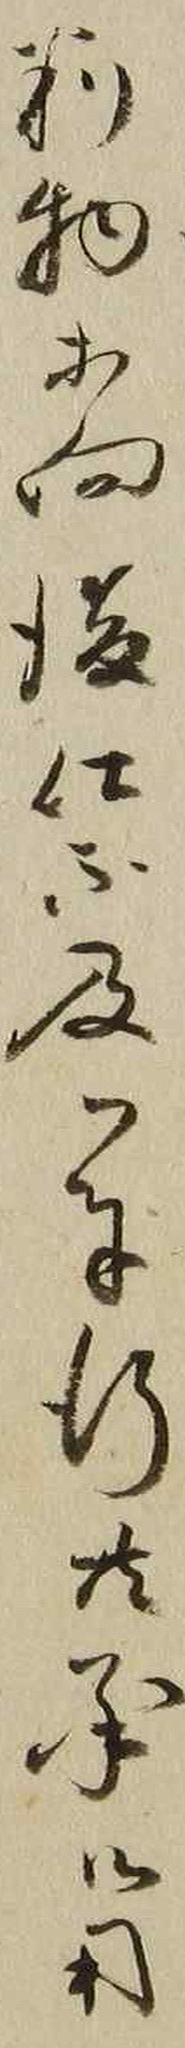判物等向後仕不及御奉行共承御用
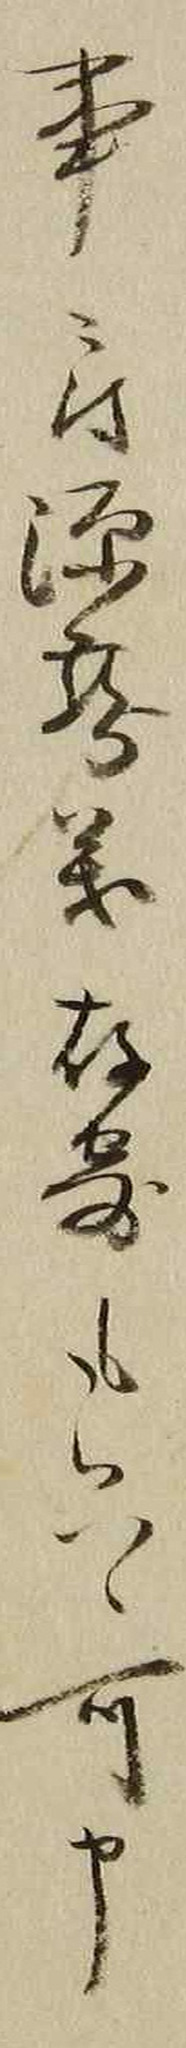事に付源蔵義存寄も候はゝ可申
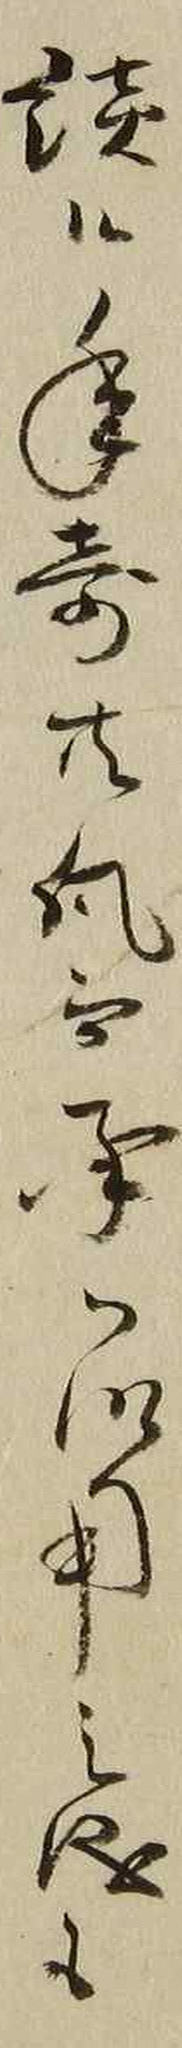談候年寄共向而承候御用之儀も
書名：諸士系譜　巻之269　さ之部1
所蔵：会津若松市立会津図書館
